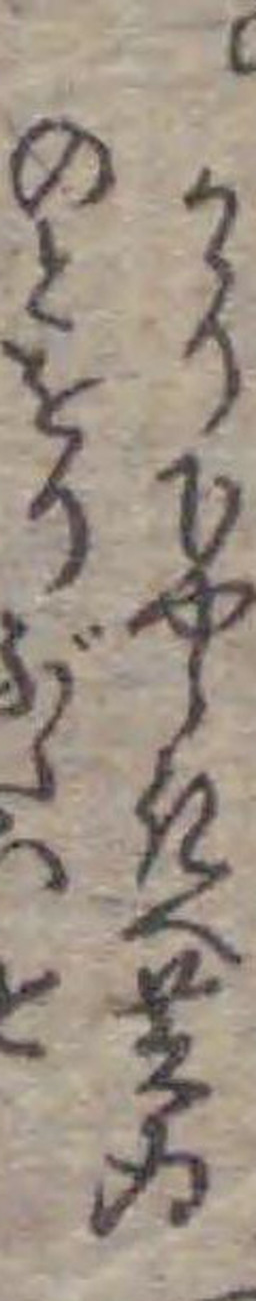のとをりぶたいを
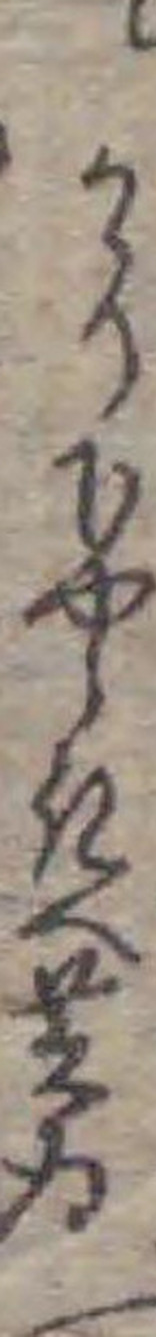かゝり下やしきへ芝ゐ
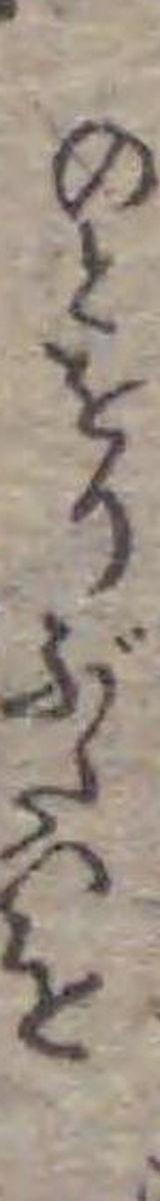のとをりぶたいを
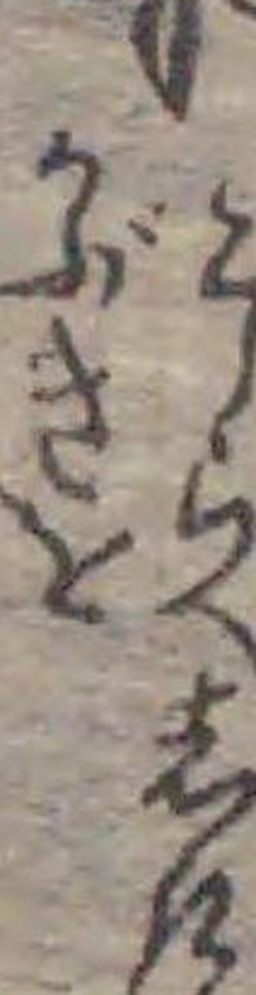かぶきを
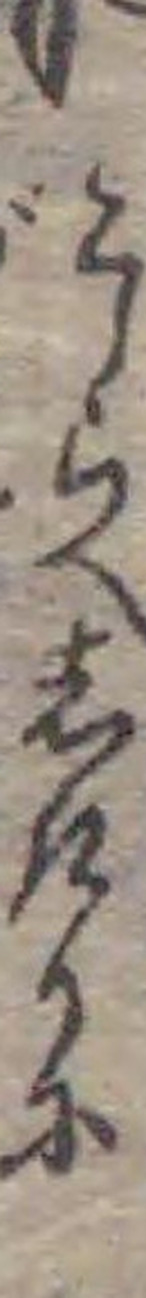こしらへしきりに
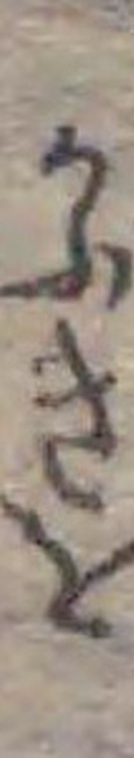かぶきを
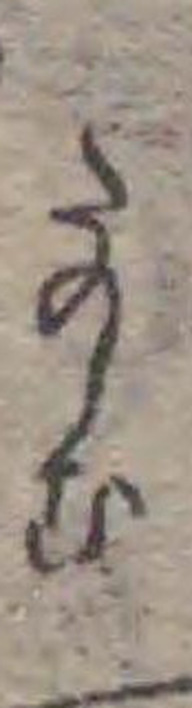たのしむ
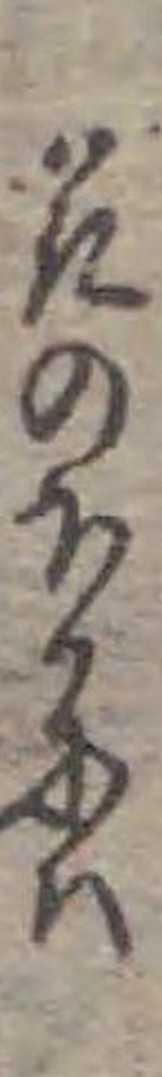花のほかには
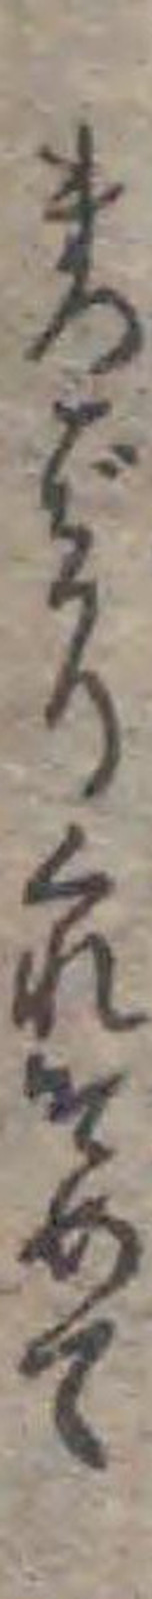まつばかりくれそめて
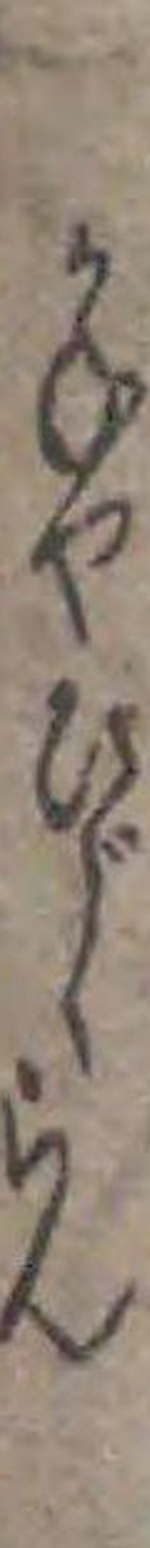かねやひゞくらん
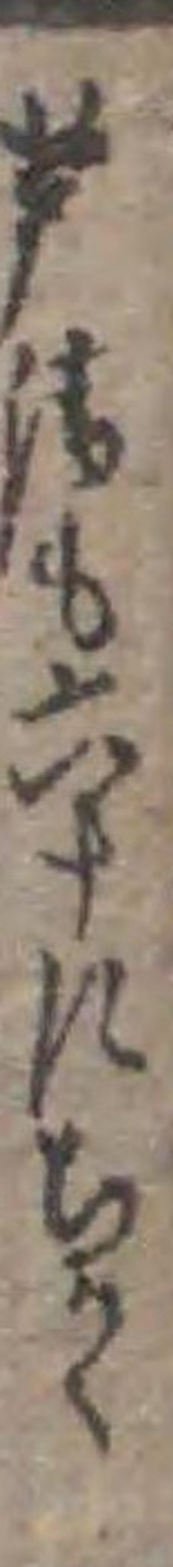芦清も六十にちかく
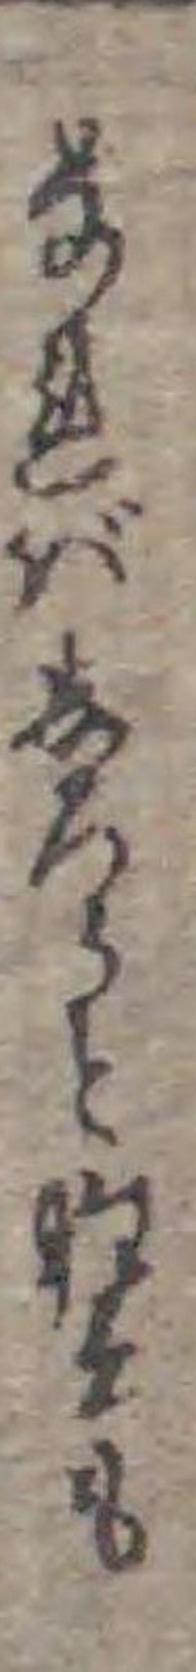なればしろうと狂言も
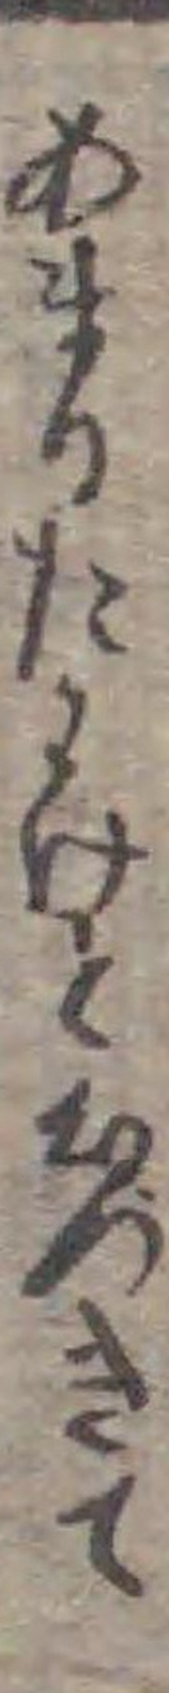あまりたわけと心つきて
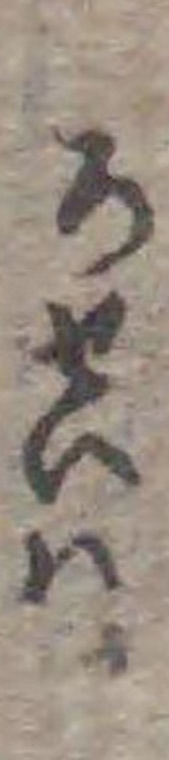ろせいは
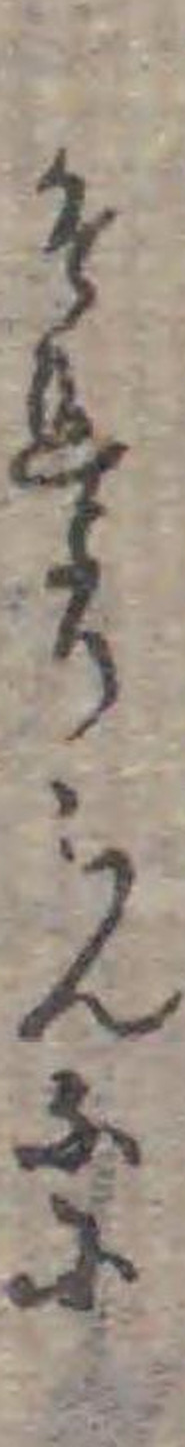それよりらんふに
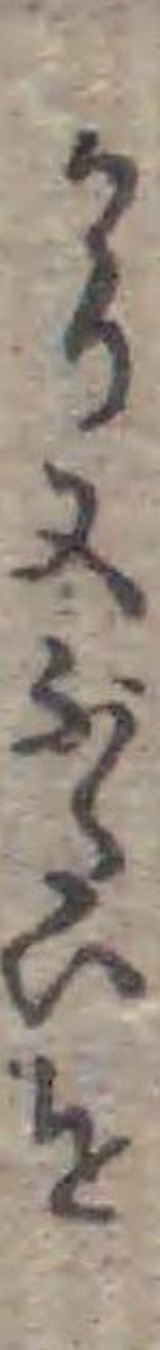かゝり又ぶたいを
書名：見徳一炊夢 : 3巻
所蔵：国立国会図書館 National Diet Library, JAPAN
